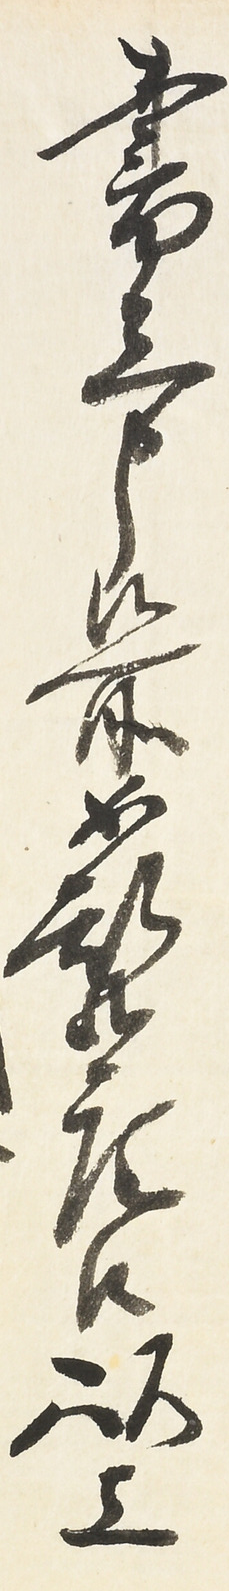書上申候所如斯御座候以上
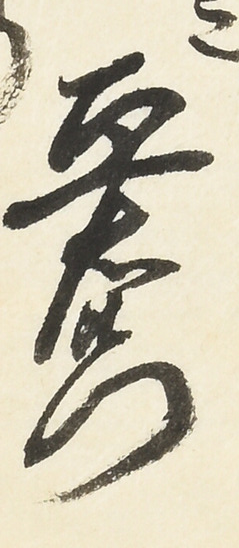平右衛門
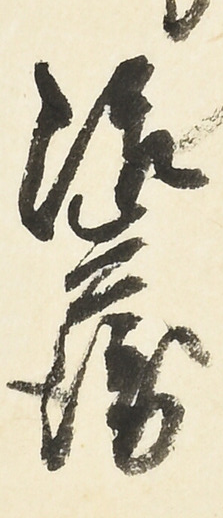治兵衛

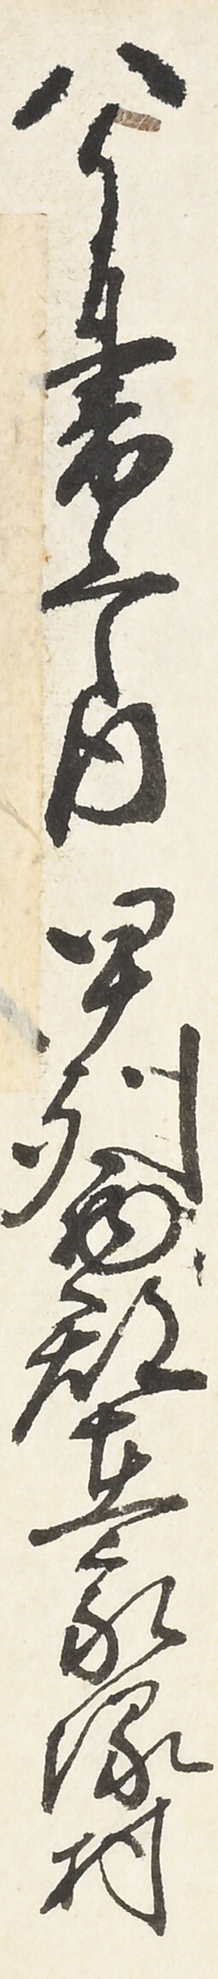八月書上之内甲州西郡在家塚村
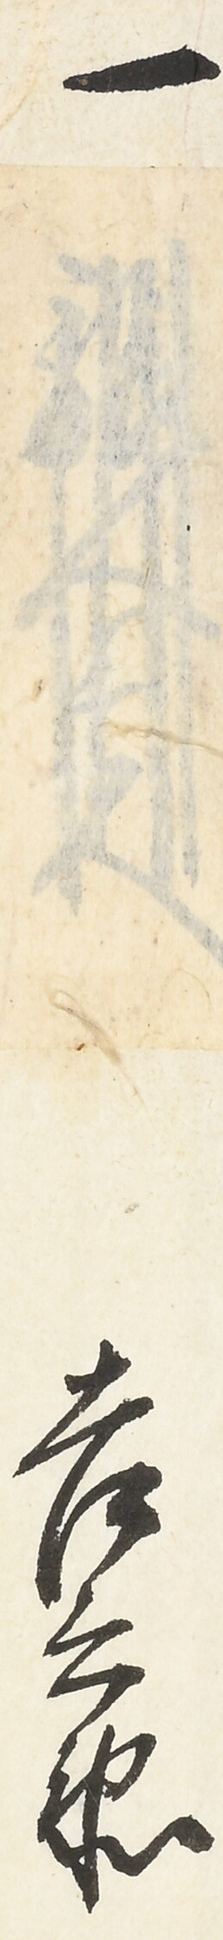一吉兵衛
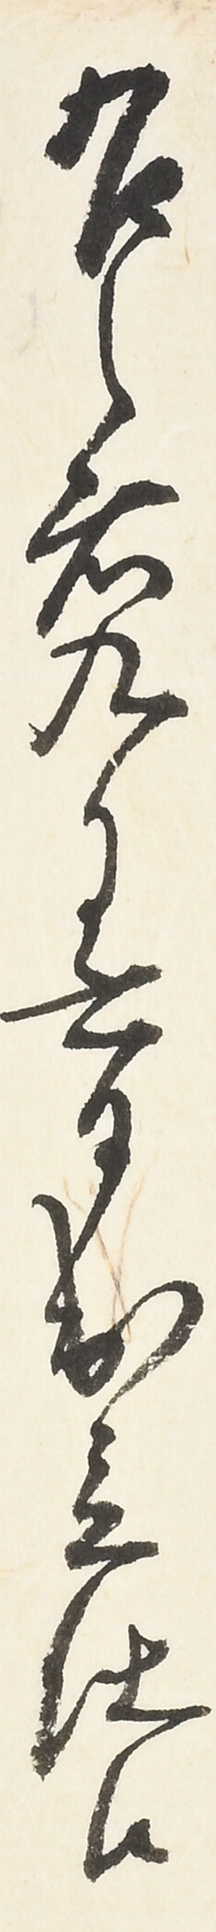右之者九月六日出立仕候
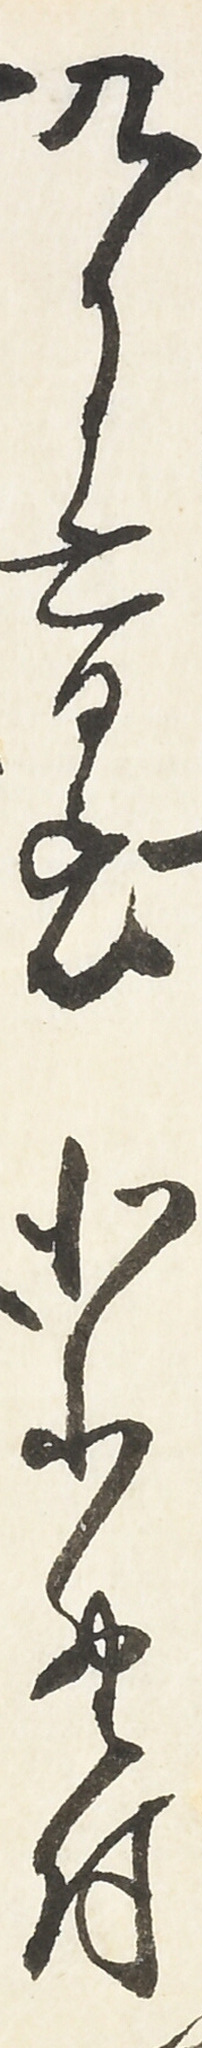九月六日着北小野村
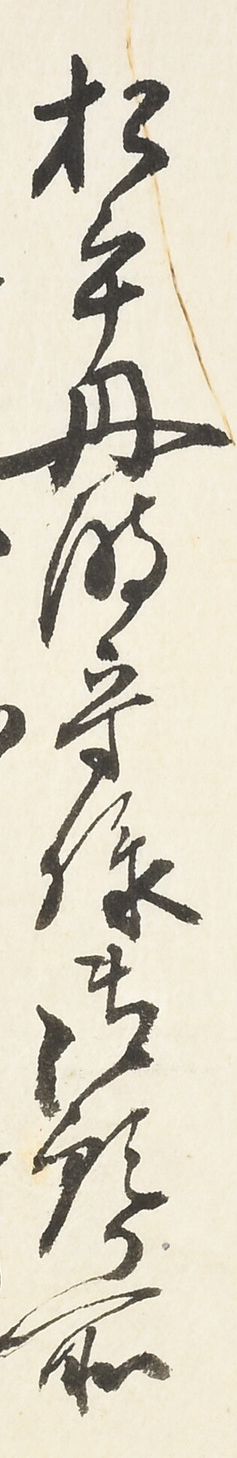松平丹波守様御預り所
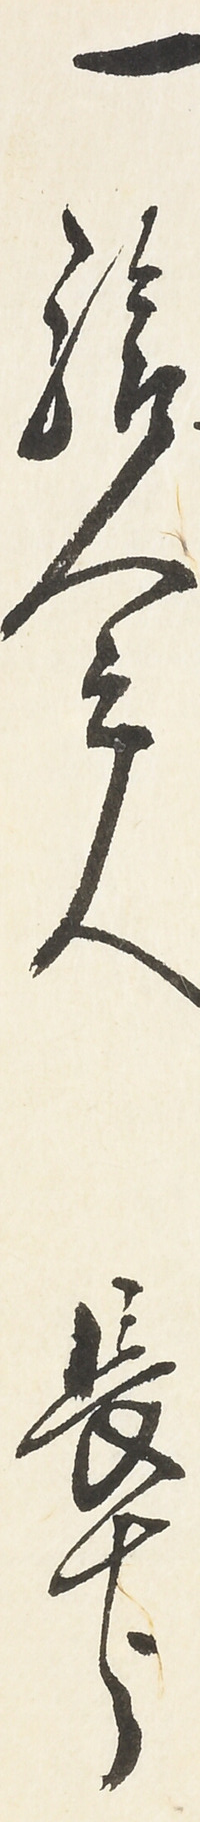一旅人壱人長十郎
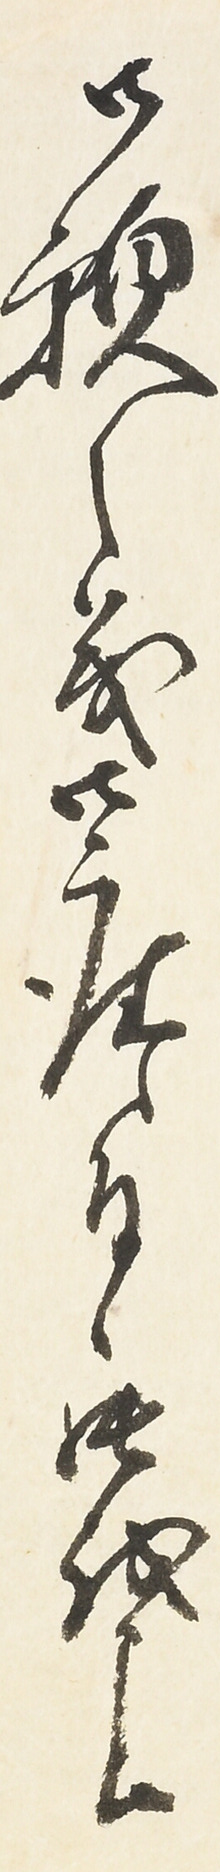御願之義御座候付罷越申候
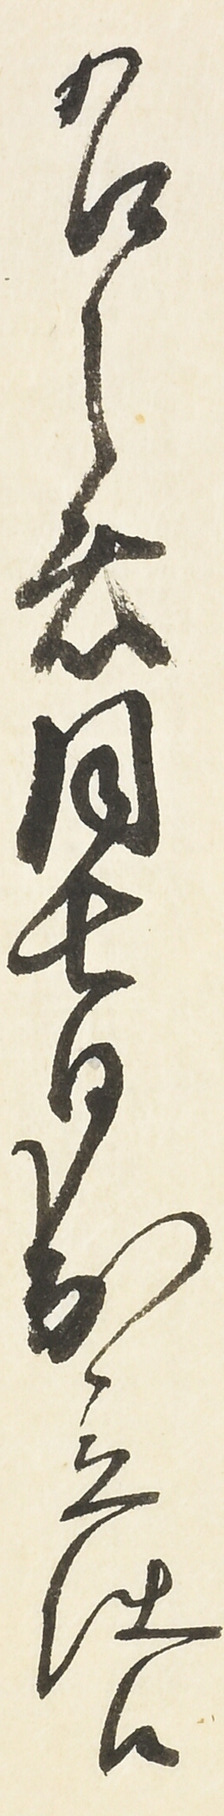右之者同七日出立仕候
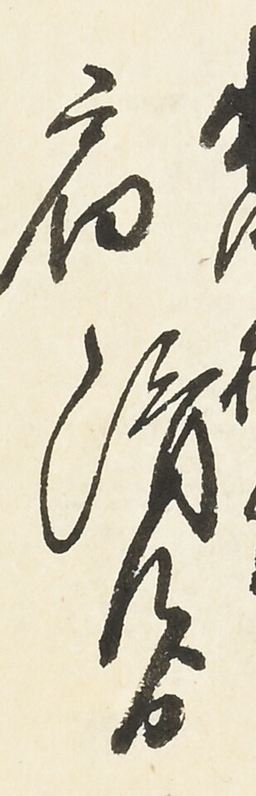宿清左衛門
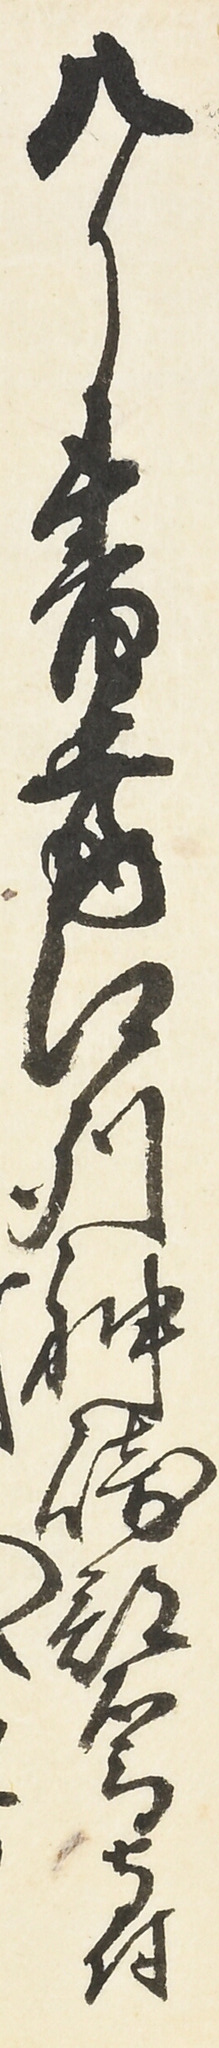八月書上之内江州神崎郡石馬寺村
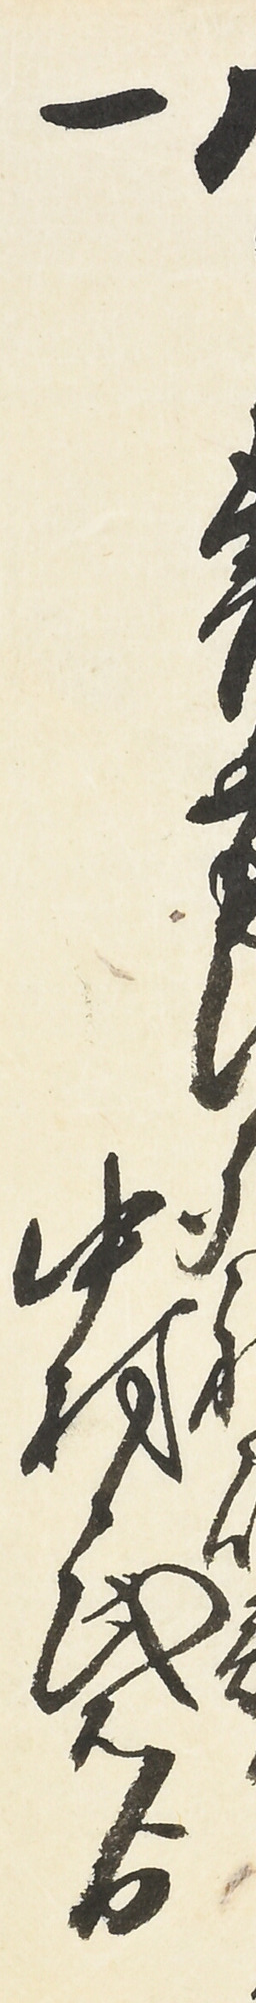一中村武右衛門
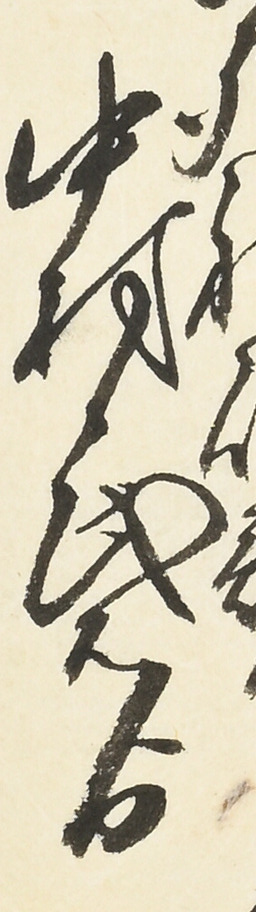一中村武右衛門
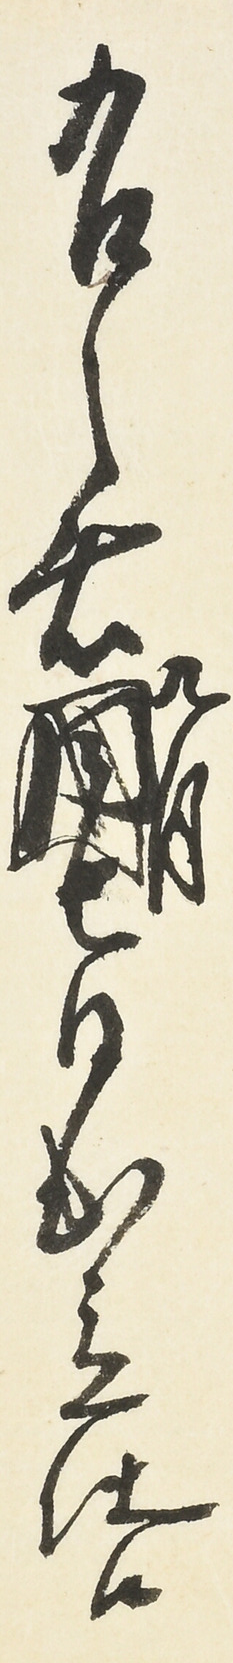右之者同七日出立仕候
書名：町中旅人泊控帳
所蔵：伊那市立高遠町図書館・合同会社AMANE
